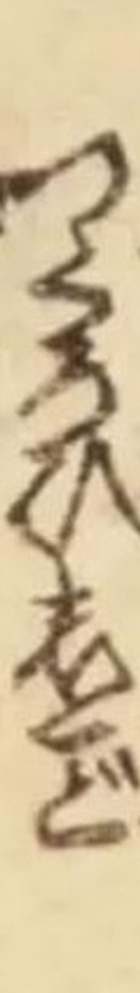つくろひしごと
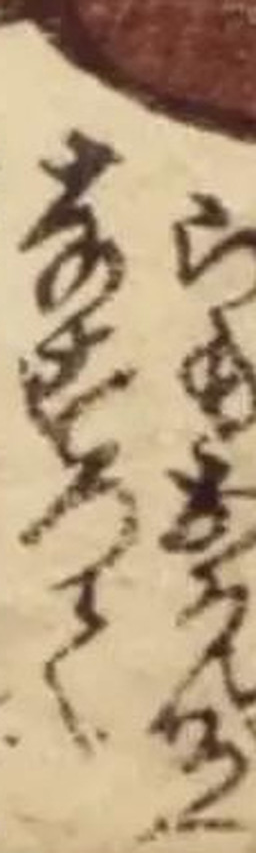なすつて
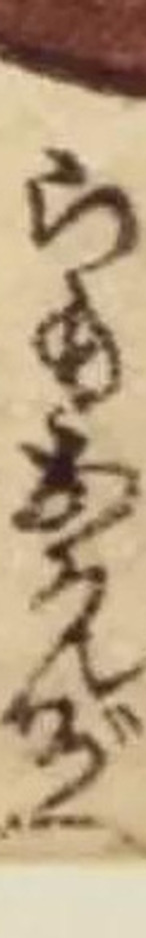らもおかんがへ
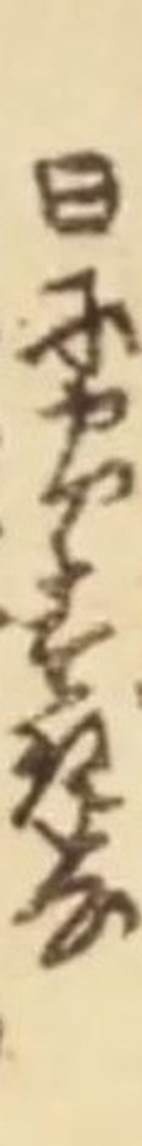日にやアすきな
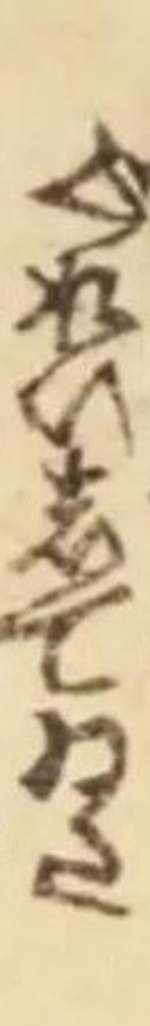ぐれいしてゐた
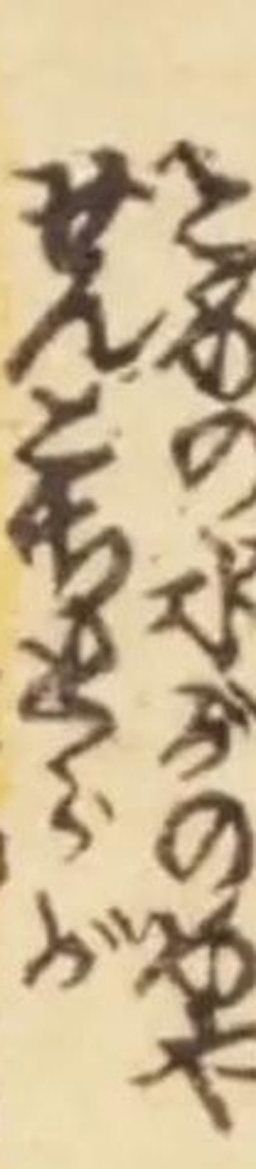せんこちとらが
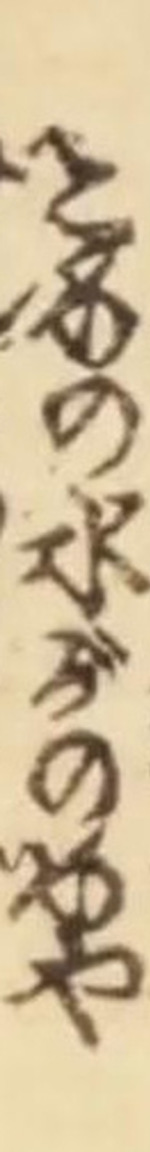との水がのめや
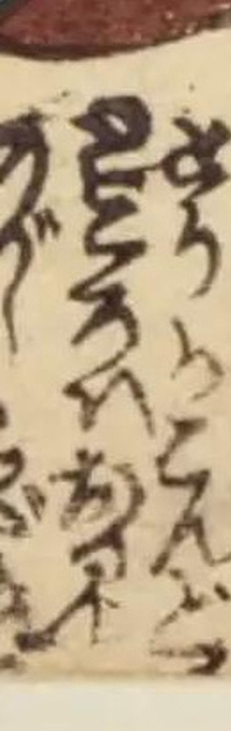ところはお見
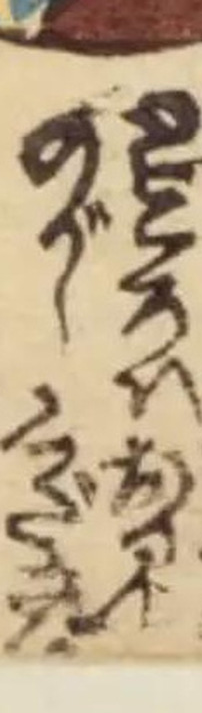のがしくだされ
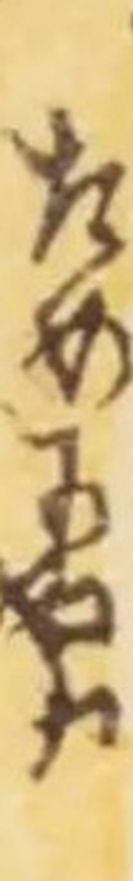ためにやア
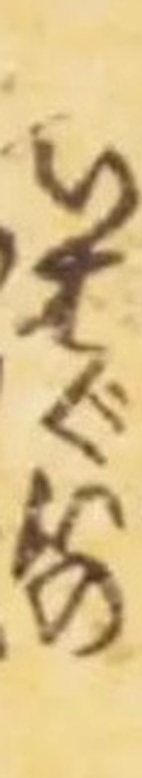いはぐいの
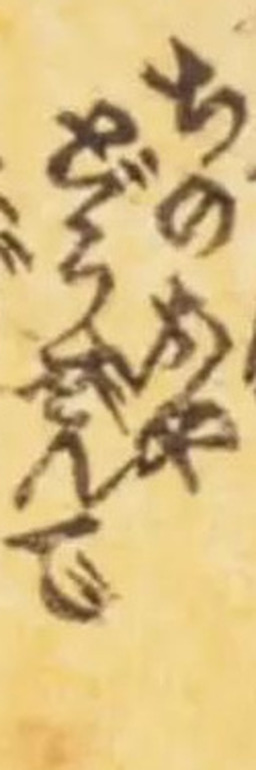どうぜんで
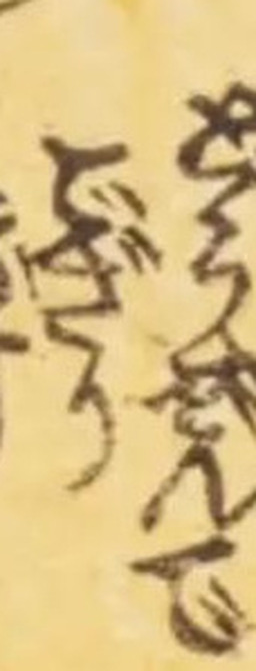ござり
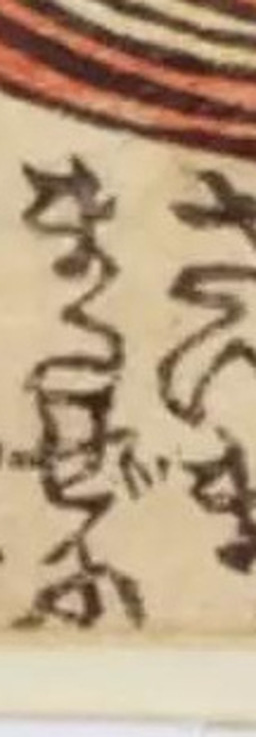またぜに
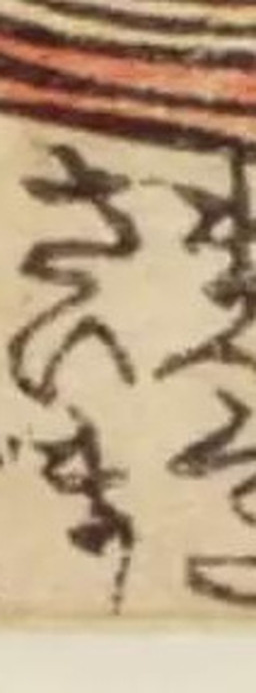さいまし
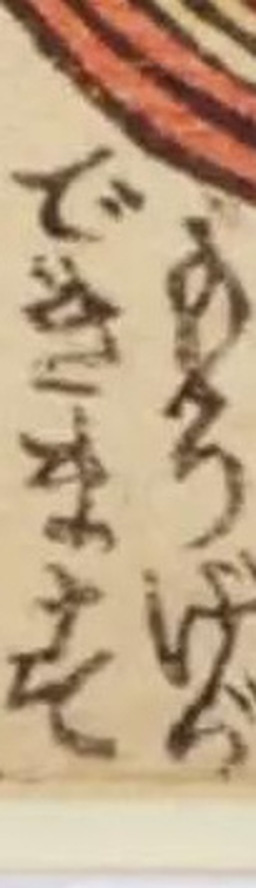できます
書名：生捕ました三度の大地震
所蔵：国立国会図書館 National Diet Library, JAPAN
